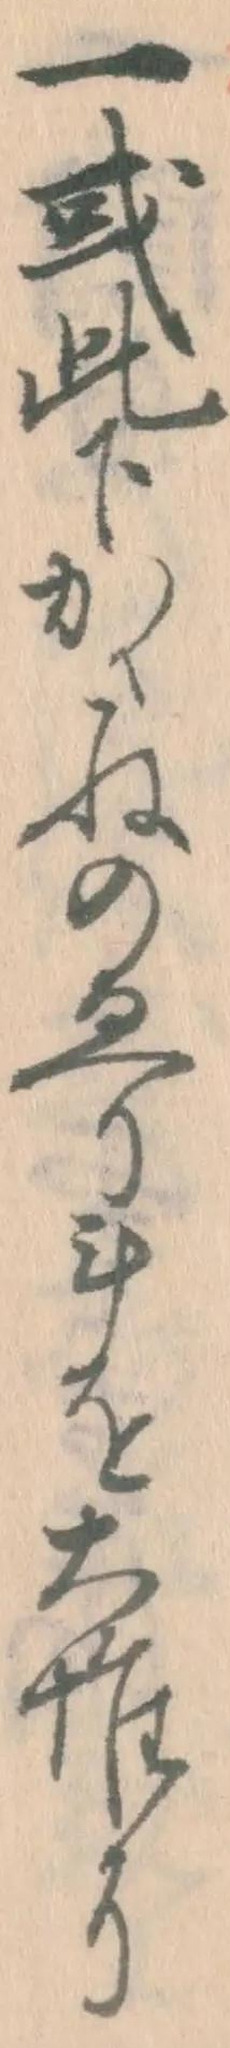一或此下かさねのゑり斗を大帷に
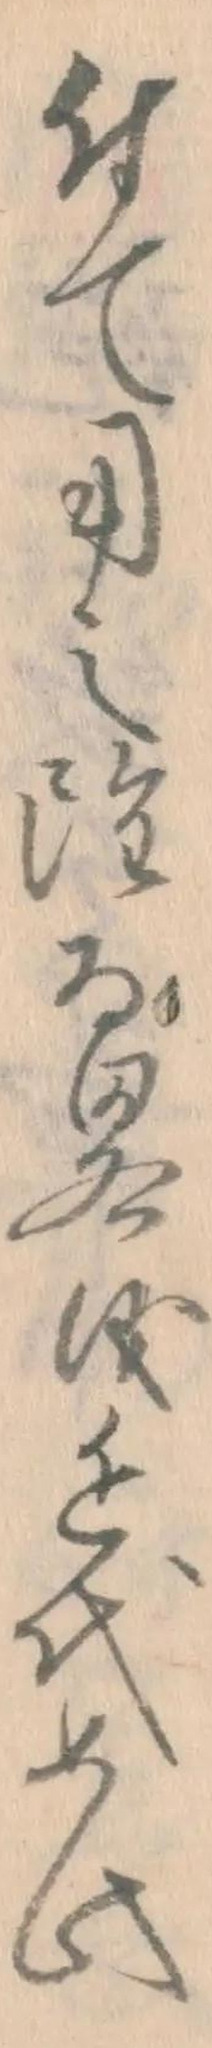付て用之雖為略儀近代如此
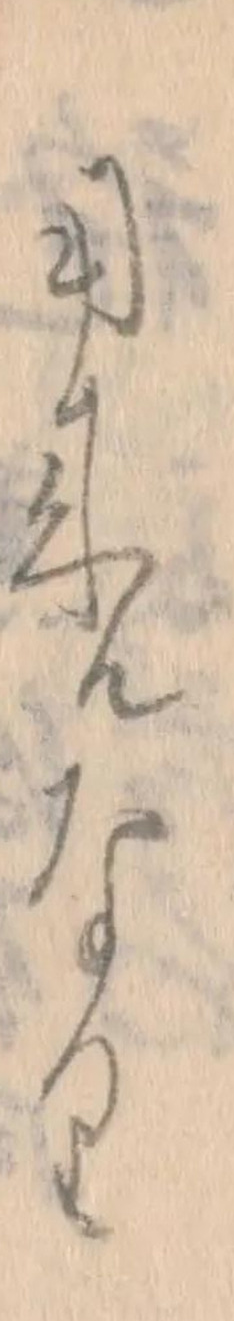用来ルなり
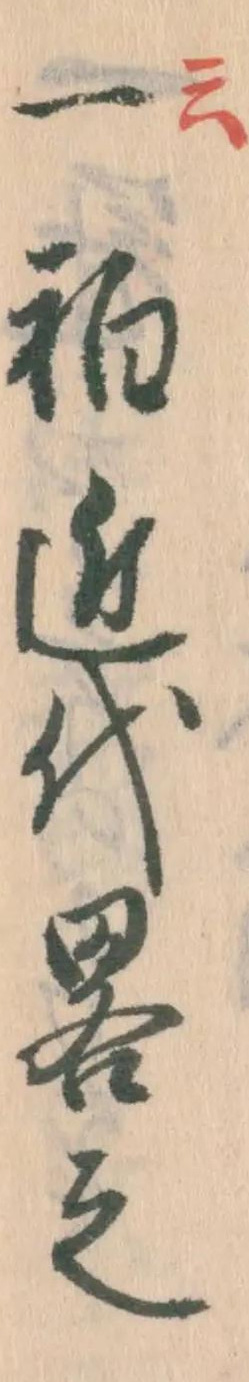一袙近代略之
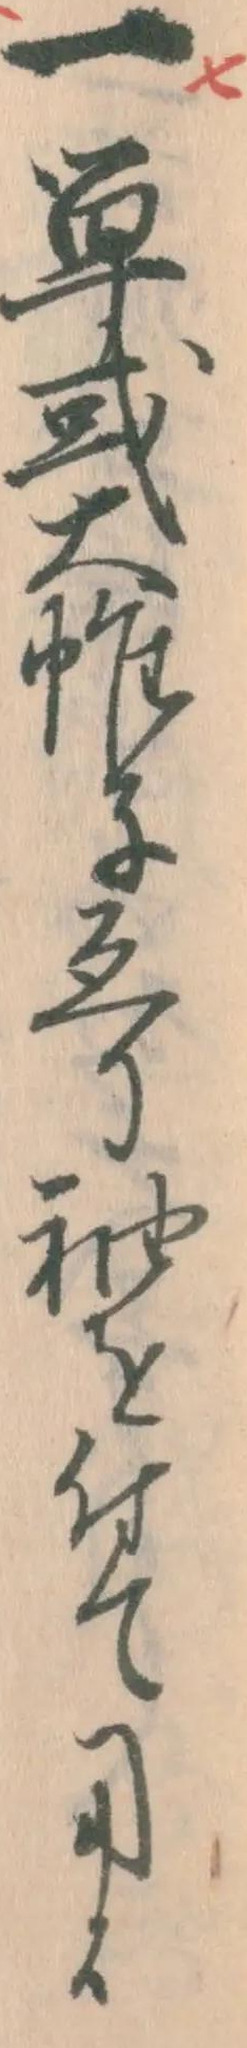一単或大帷子ゑり袖を付て用候
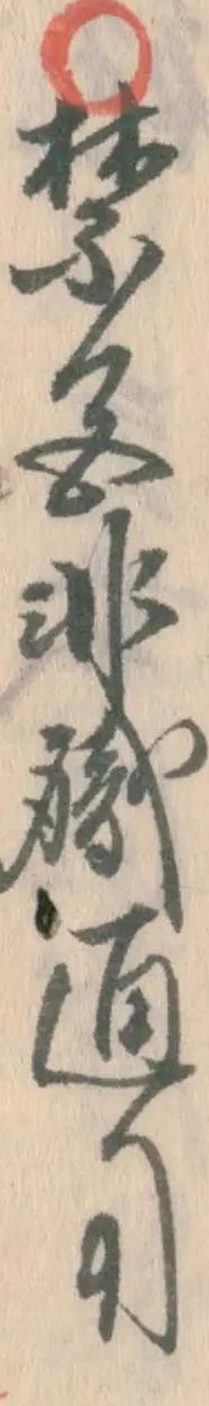○禁色非職通用
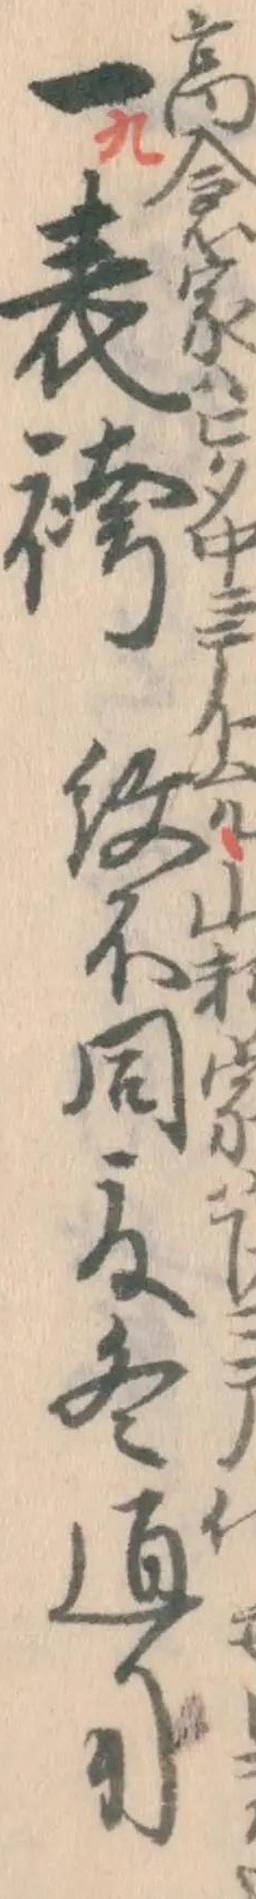一表袴紋不同夏冬通用
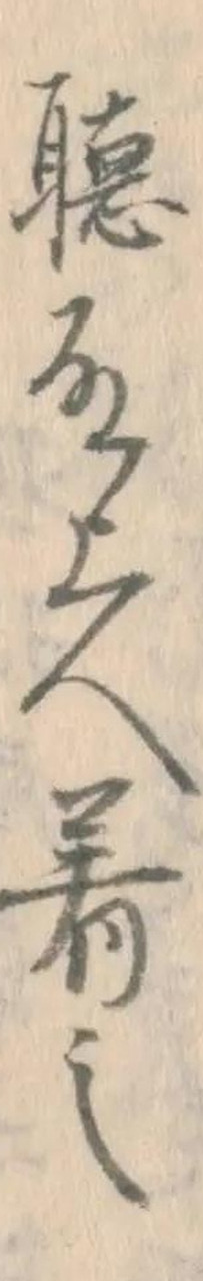聴殿上人着之
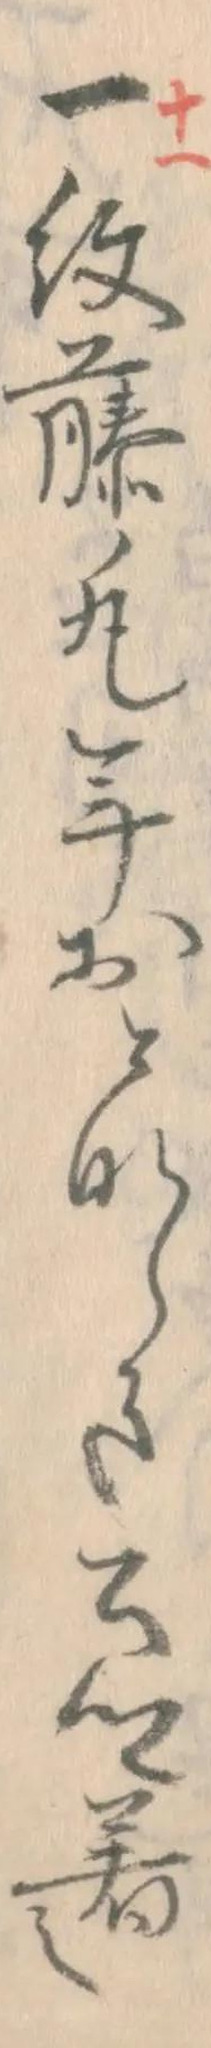一紋藤ノ丸年おとなしき公卿着之

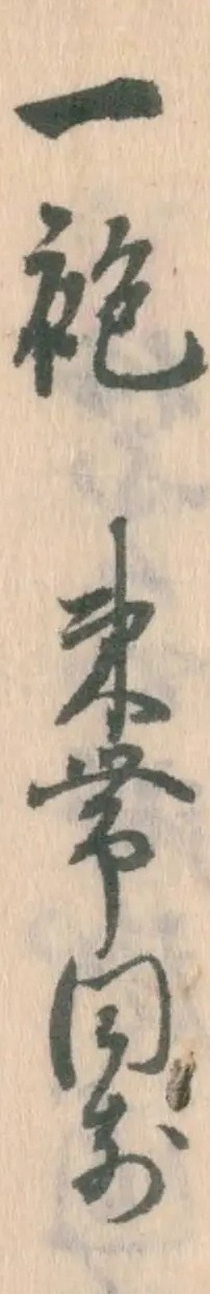一袍束帯同前
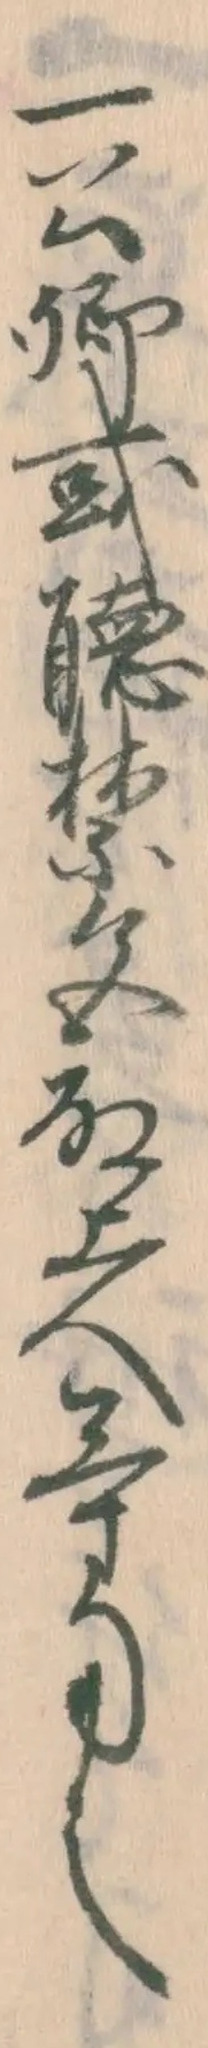一公卿或聴禁色殿上人等用之
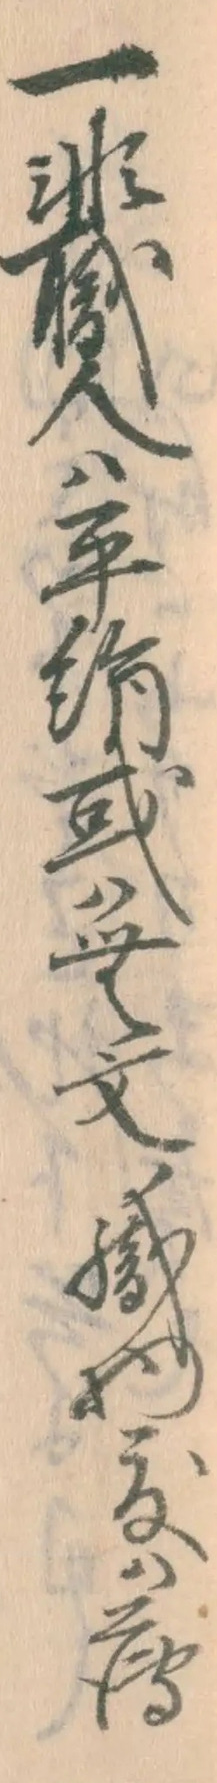一非職人ハ平絹或ハ無文ノ織物夏ハ薄
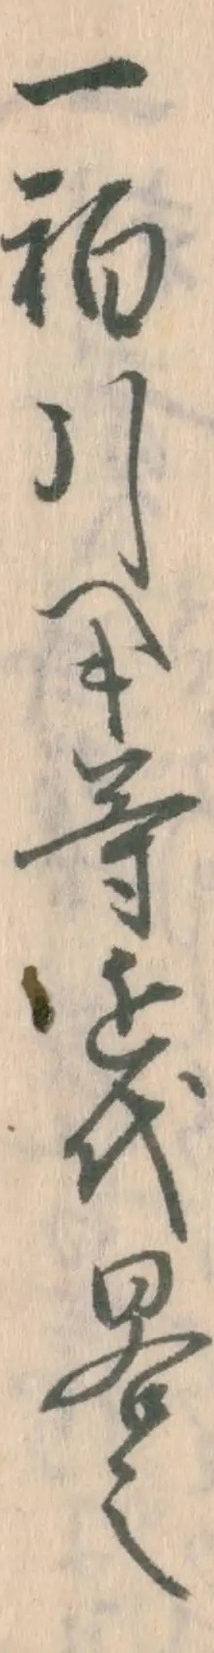一袙引ヘキ等近代略之
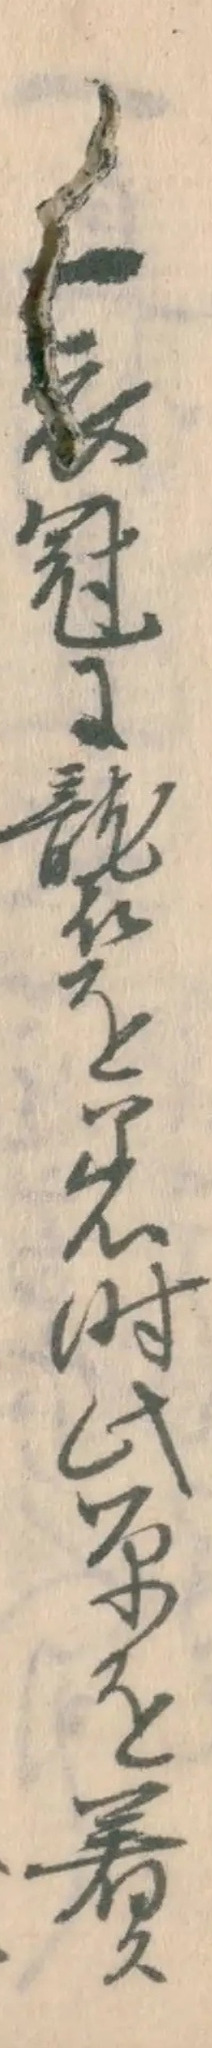一衣冠に襲を着時此単を着ス
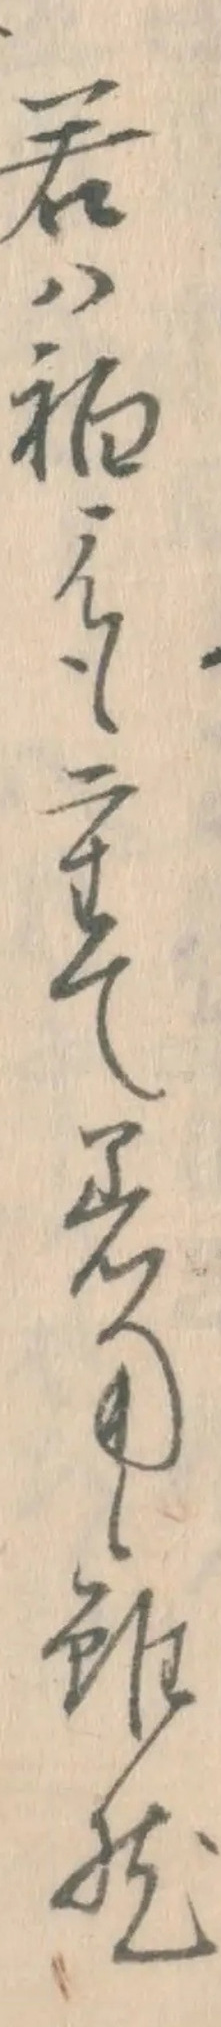若ハ袙ニても重て着用候雖然
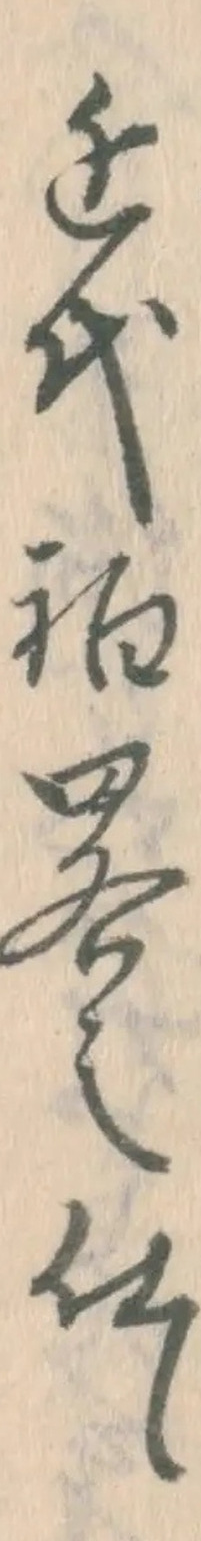近代袙略之仕候
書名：賀茂社記録. 第80冊
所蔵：国立国会図書館 National Diet Library, JAPAN
